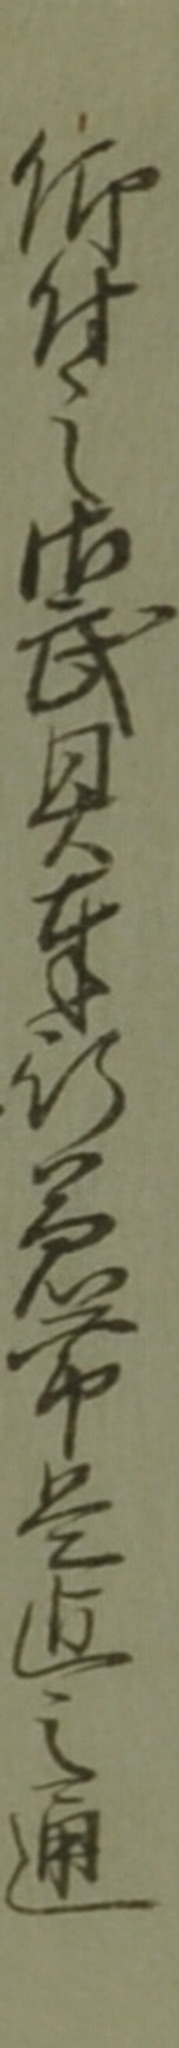仰付之御武具奉行兼帯是迄之通
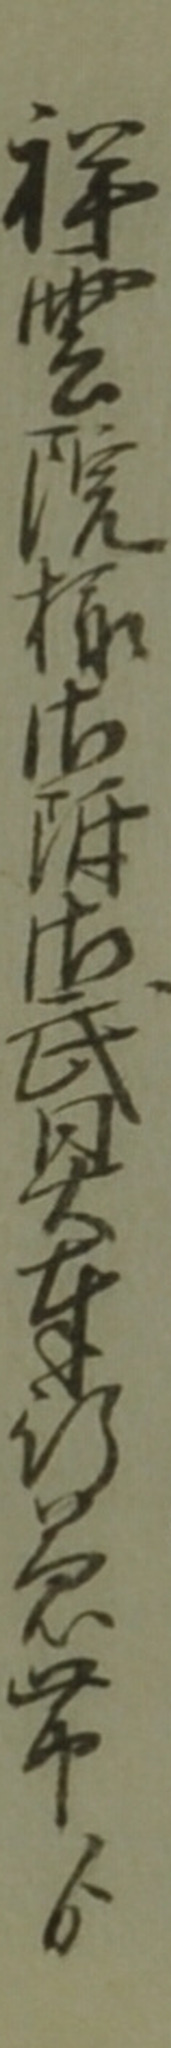祥雲院様御附御武具奉行兼帯ゟ
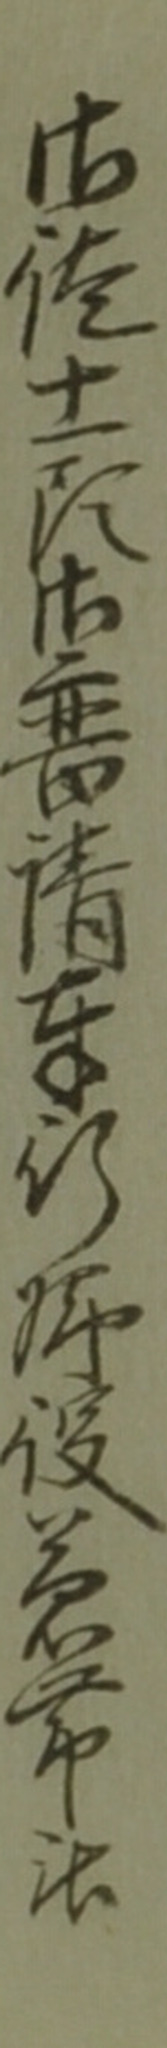御徒士頭御普請奉行帰役兼帯被
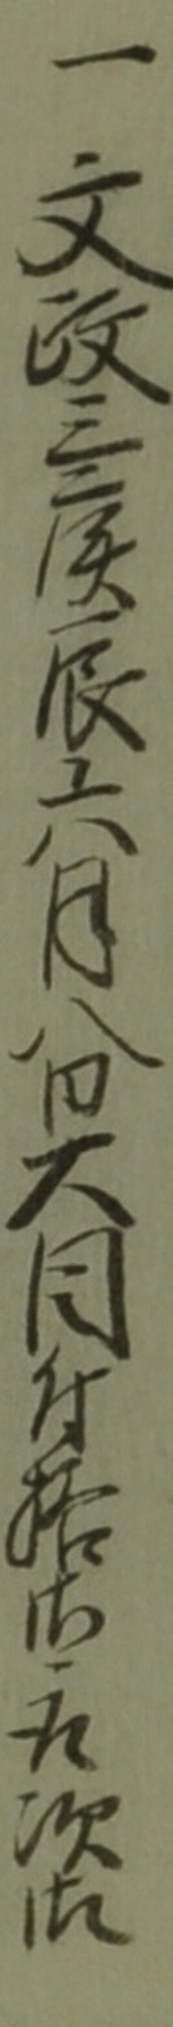一文政三庚辰六月八日大目付格御取次御
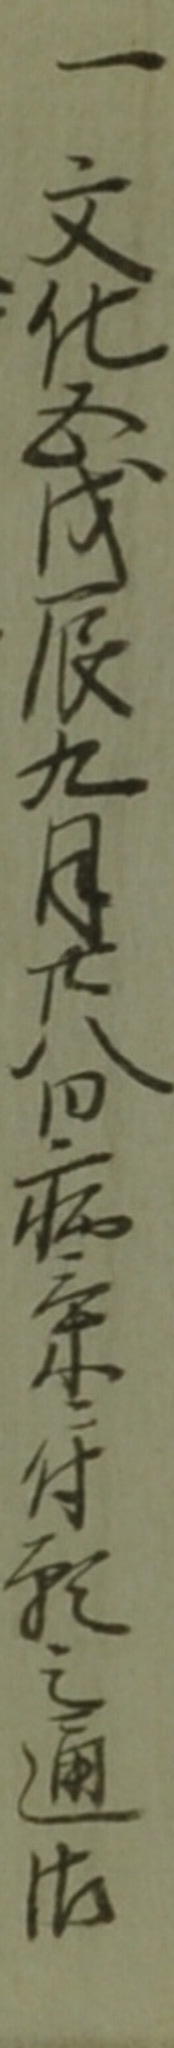一文化五戊辰九月廿八日病床ニ付願之通御
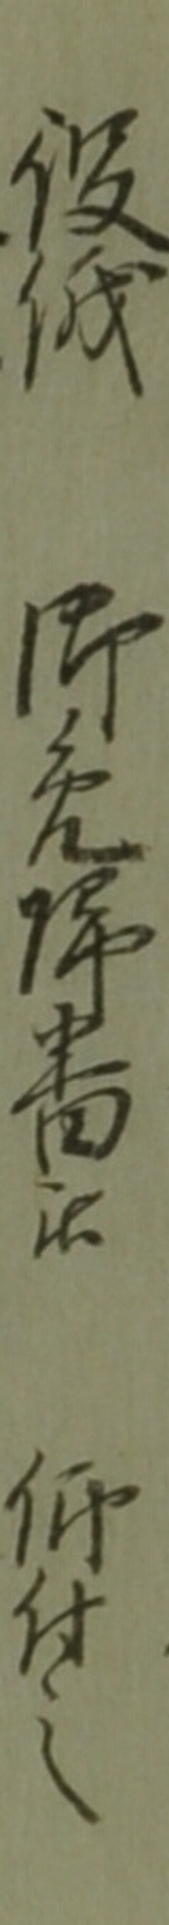役儀御免帰番被仰付之
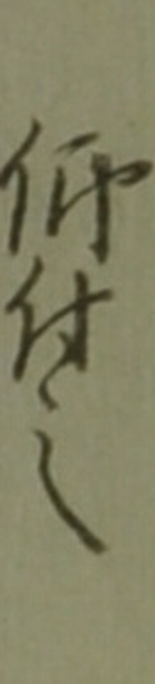仰付之
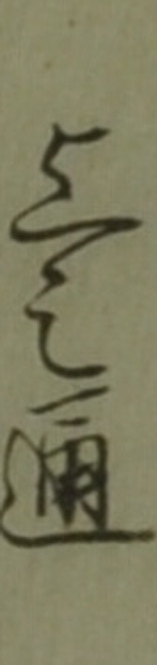迄之通
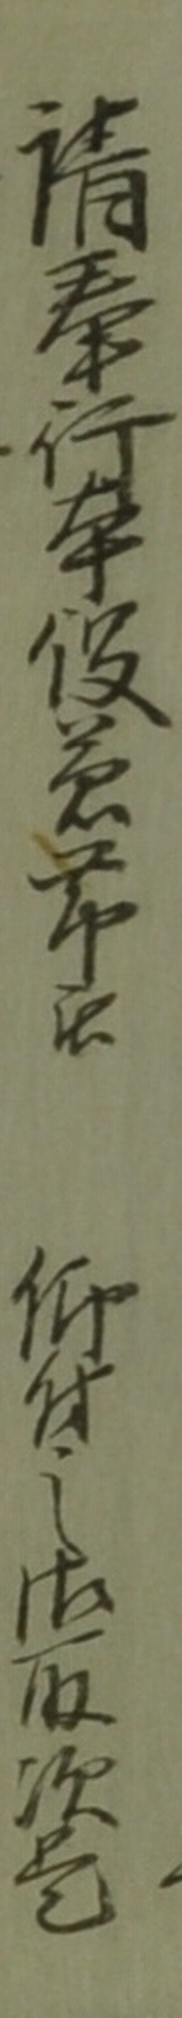請奉行本役兼帯被仰付之御取次是
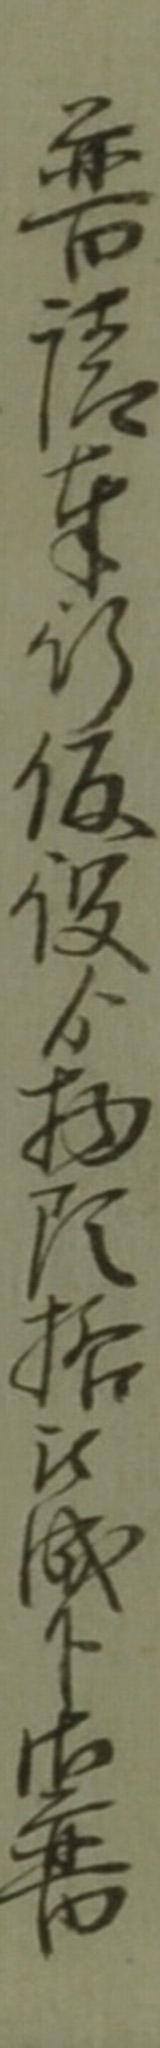普請奉行仮役ゟ物頭格被成下御普
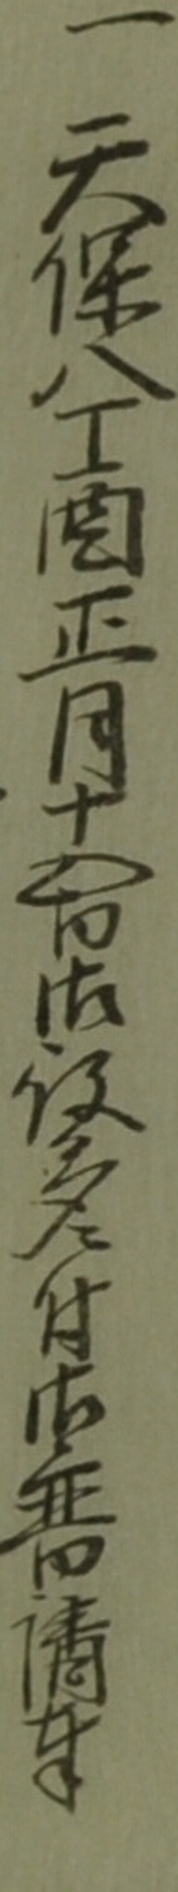一天保八丁酉正月十五日御役多ニ付御普請奉
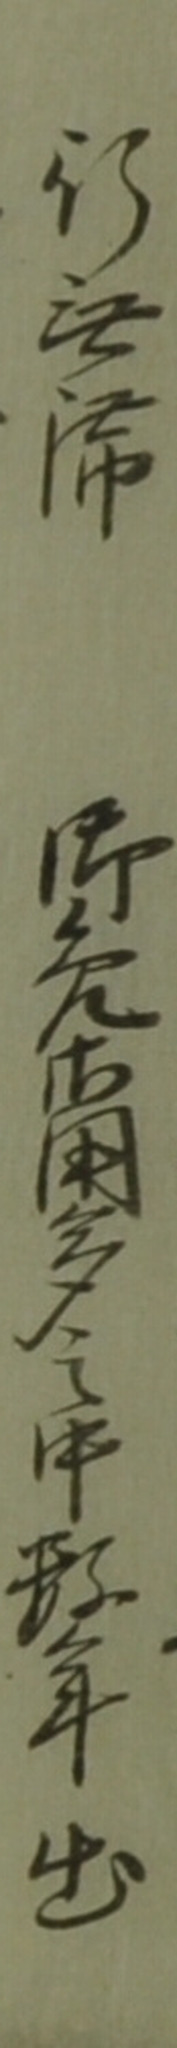行無滞御免御用多之中数年出
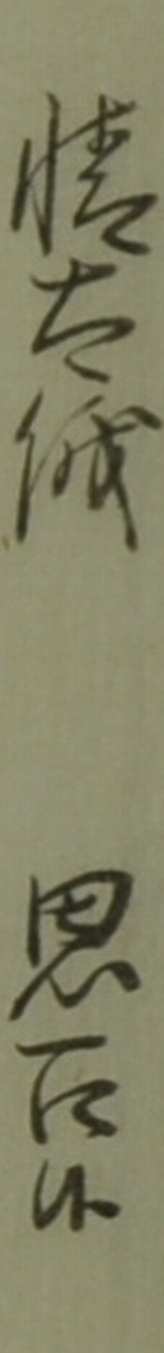精太儀思召候

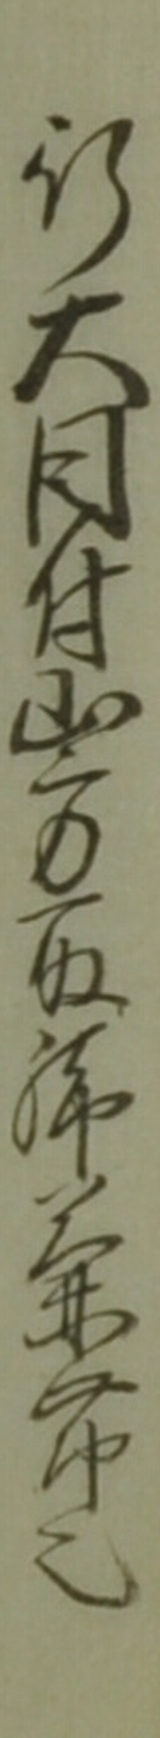行大目付山方取締兼帯也
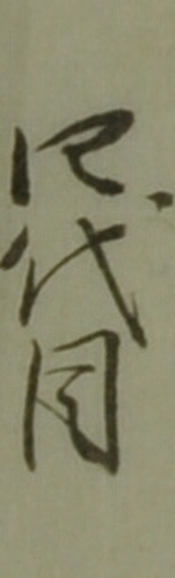四代目
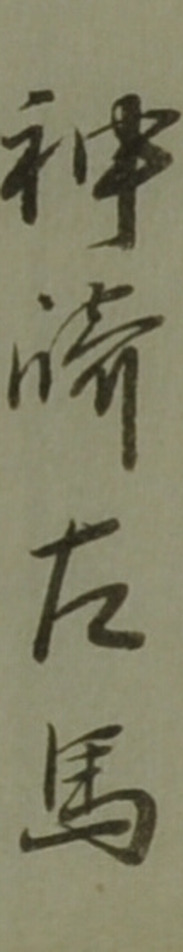神崎左馬
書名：諸御役代々録（六）
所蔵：伊那市立高遠町図書館・合同会社AMANE
